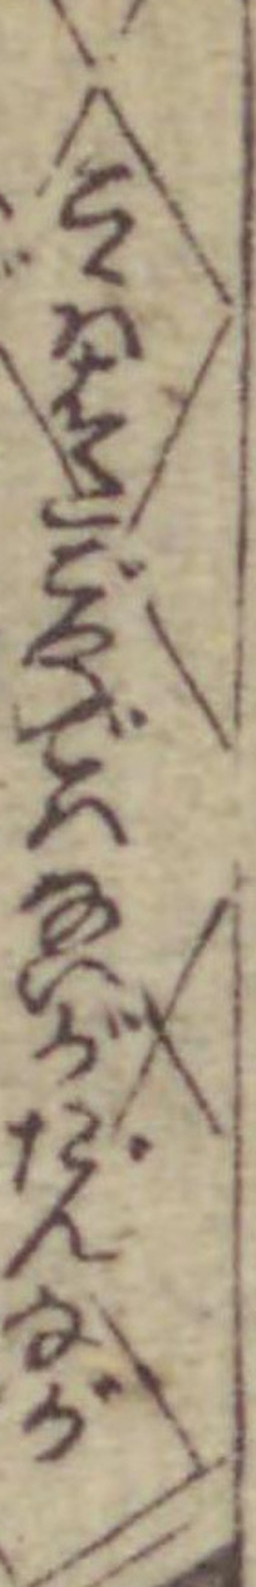こゝははたごやではないがだんなが
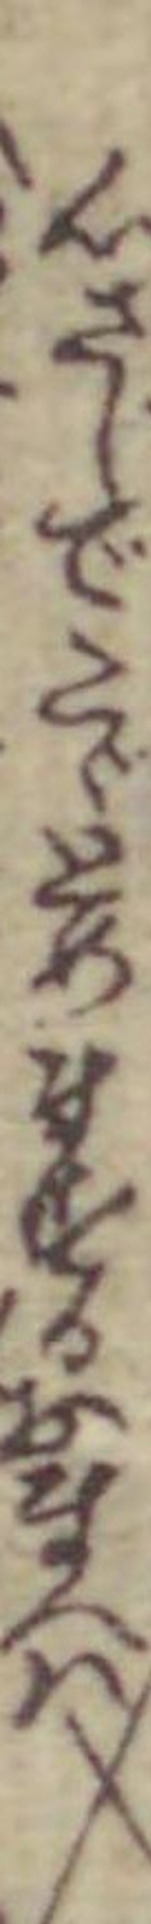心ざしでたゞとめまするおまへは
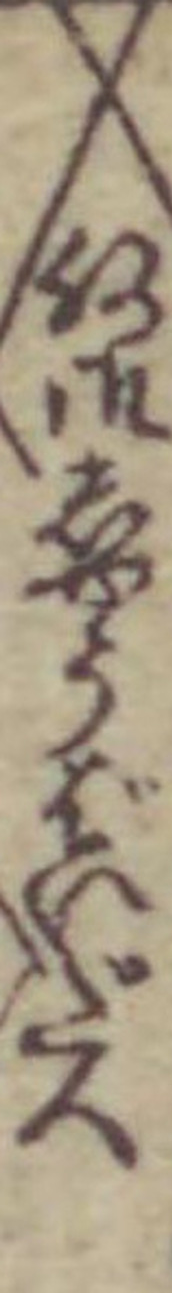何御しやうばいだへ
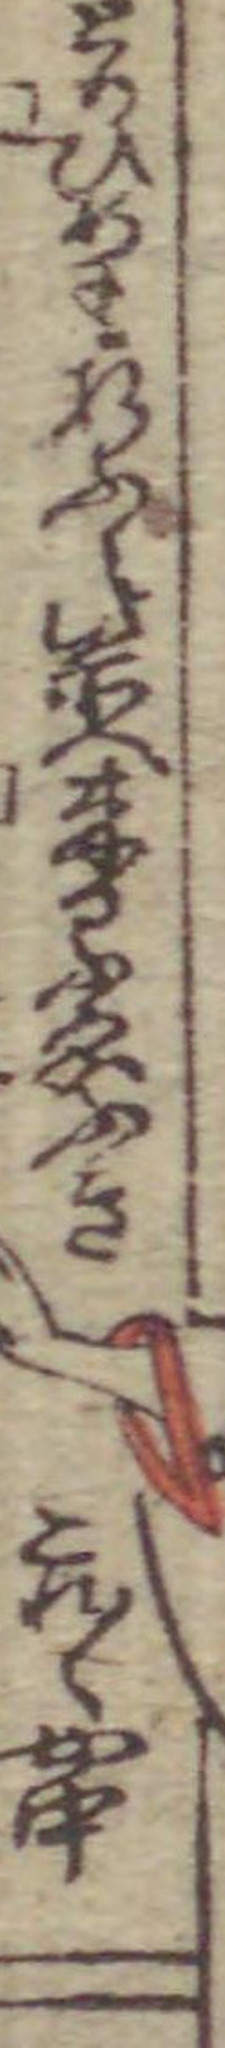はとりひめも折ふし此所へ来るふえふき
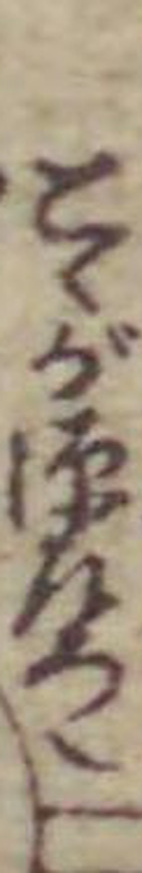こゝが源左衛門
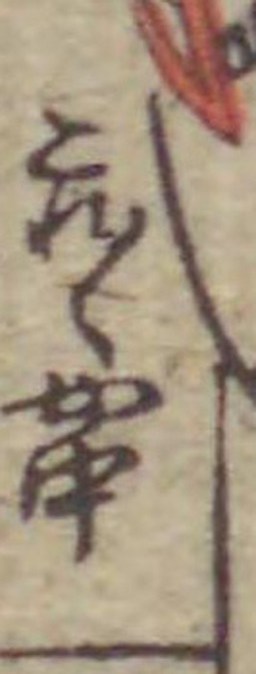これ〳〵女中
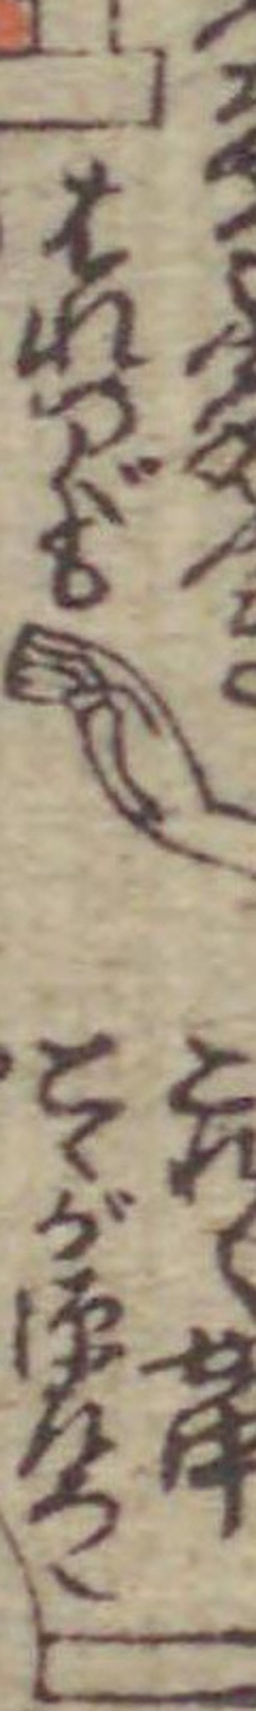はれつぐも
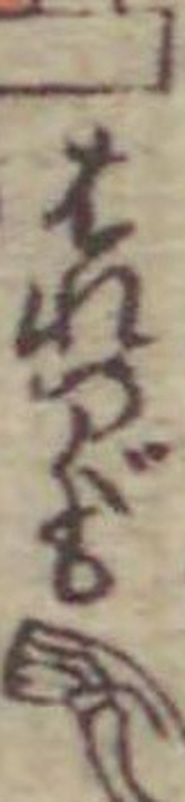はれつぐも
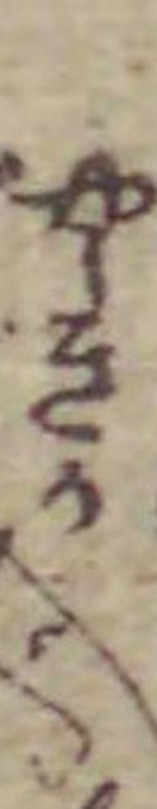やしきか
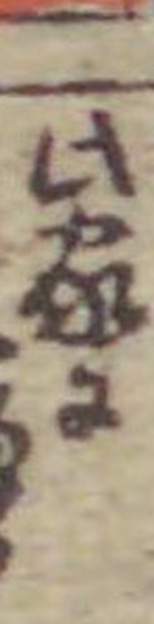此家に
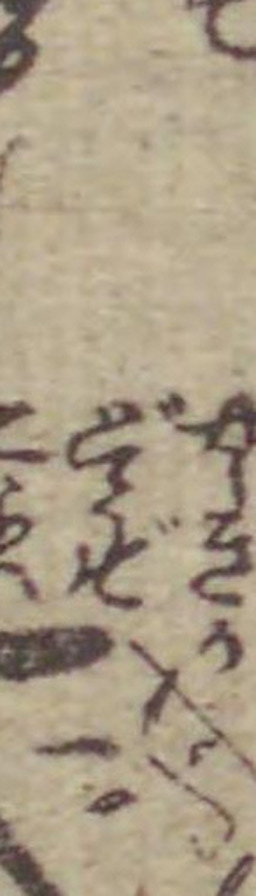どうそ
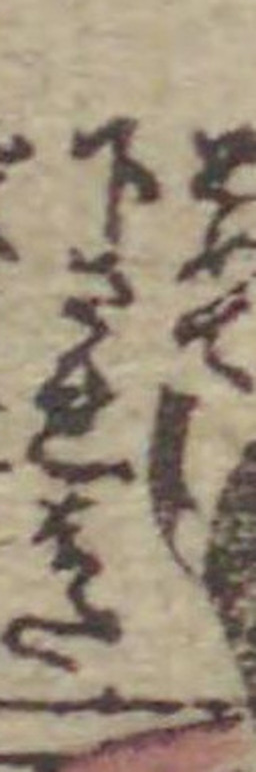下されはた
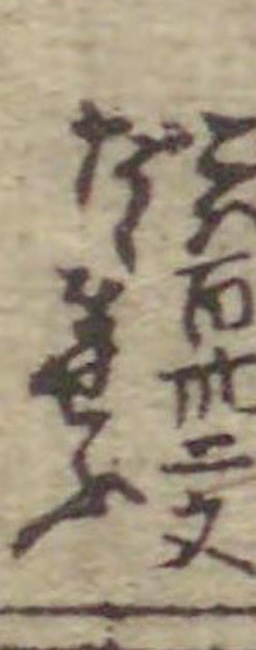だしませふ
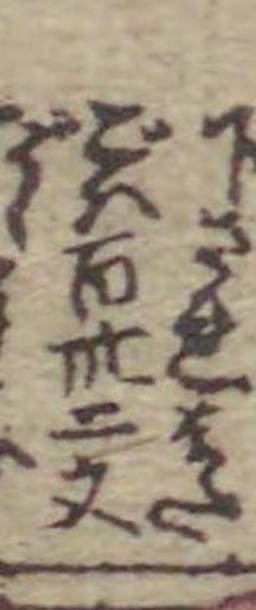ごは百卅二文
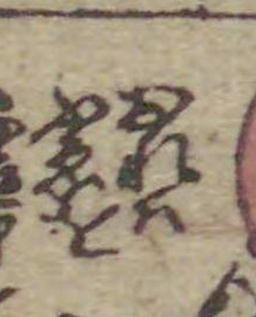おれは
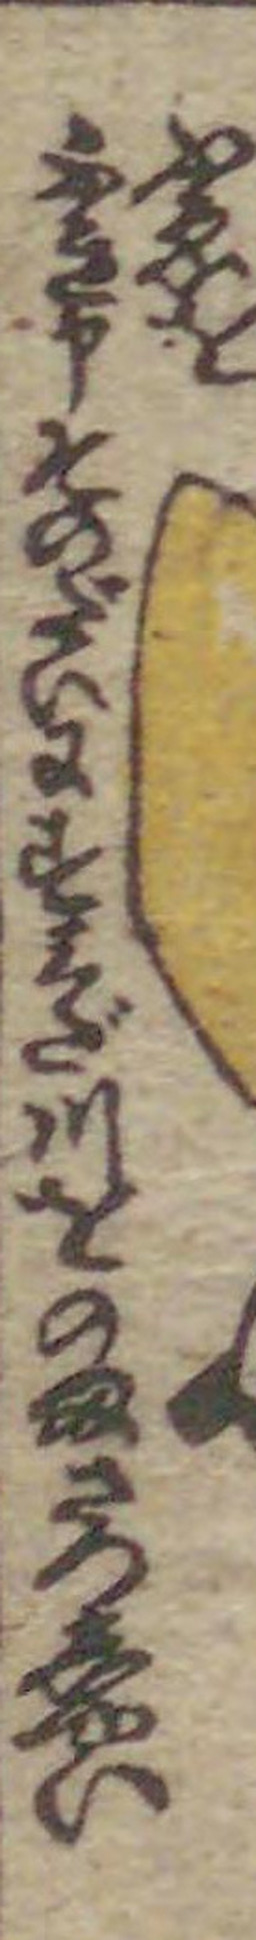ふき申そのだいにすみだ川をのまさつしやい
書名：娜二代鉢木 5巻
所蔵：国立国会図書館 National Diet Library, JAPAN
